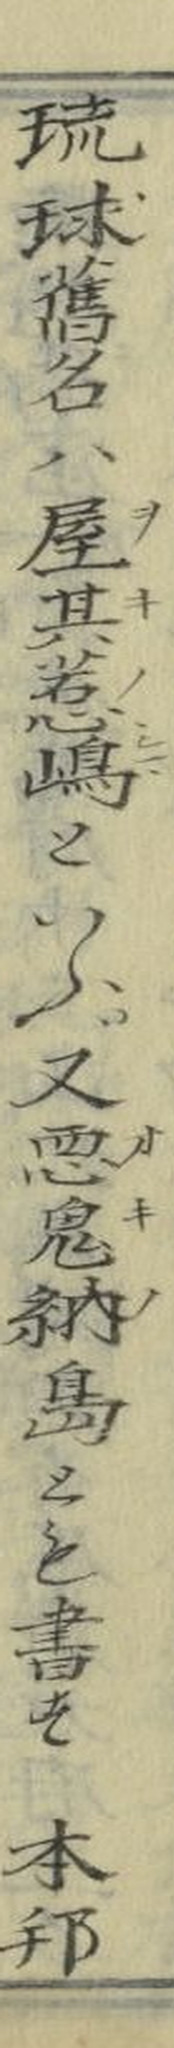琉球旧名は屋其惹嶋といふ。又悪鬼納島とも書す本邦
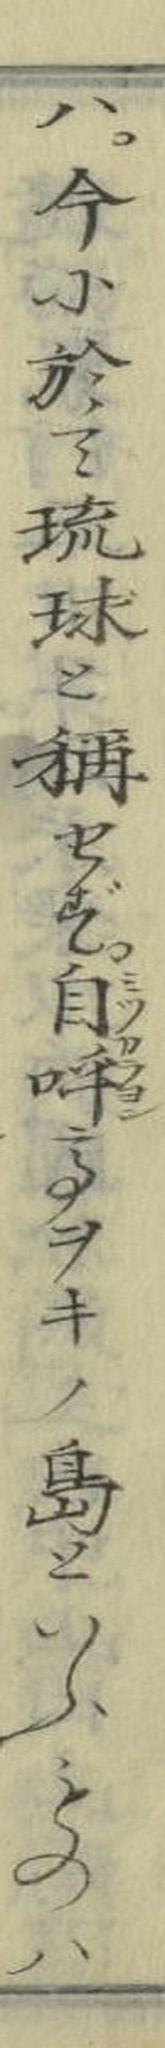は。今に於て琉球と称せず。自呼てヲキノ島といふものは
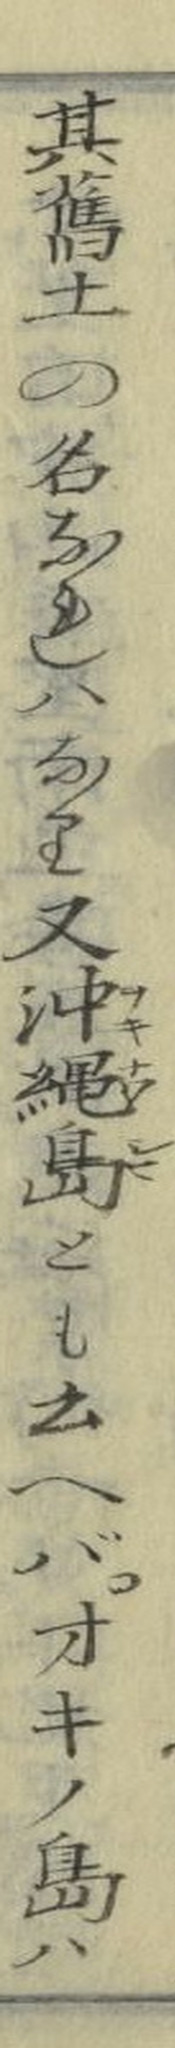其旧土の名なれはなり又沖縄島とも云へば。オキノ島は
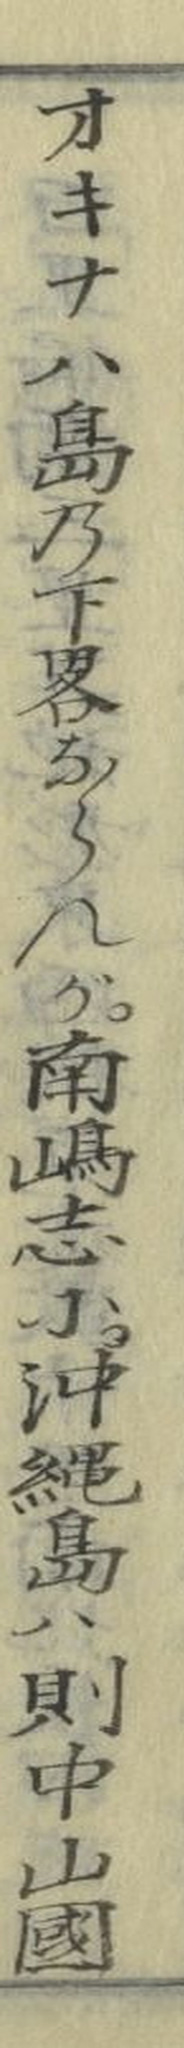オキナハ島の下略ならんが。南嶋志に。沖縄島は則中山国
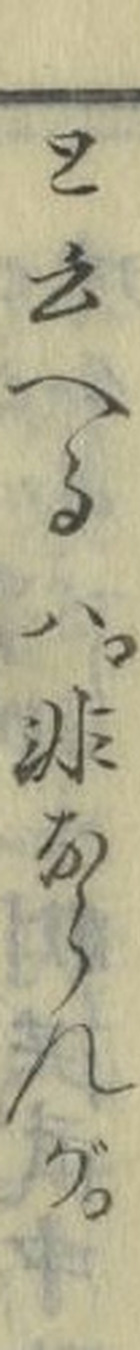と云へるは。非ならんが。

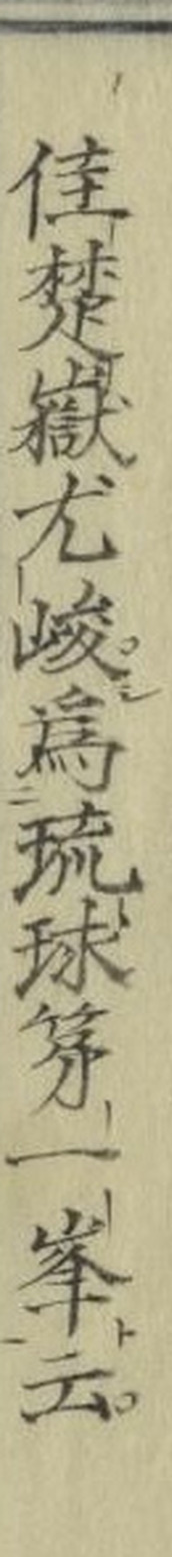佳-楚-嶽尤-峻也。為琉-球第-一-峯云。

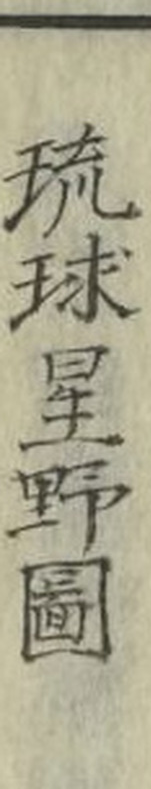琉球星野図
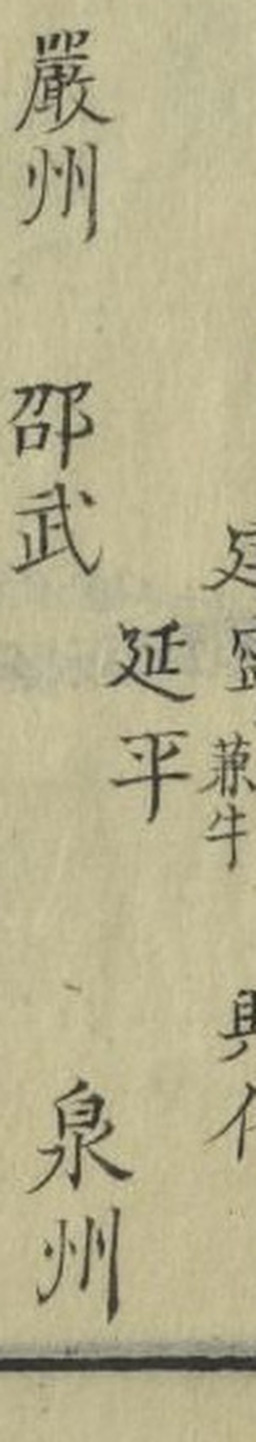厳州邵武延平泉州

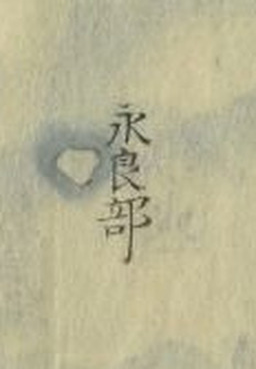永良部

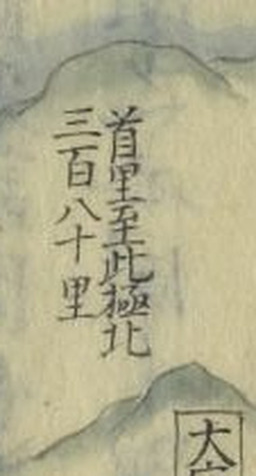首里至此極北

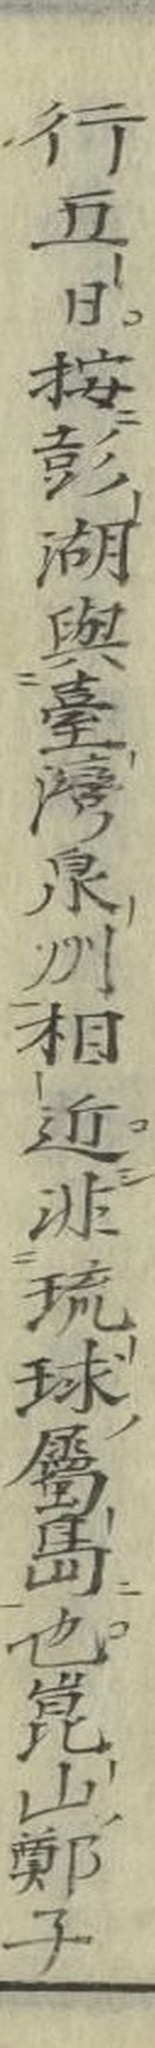行五-日按彭-湖与台-湾泉-州相-近非琉-球属-島也崑-山鄭子
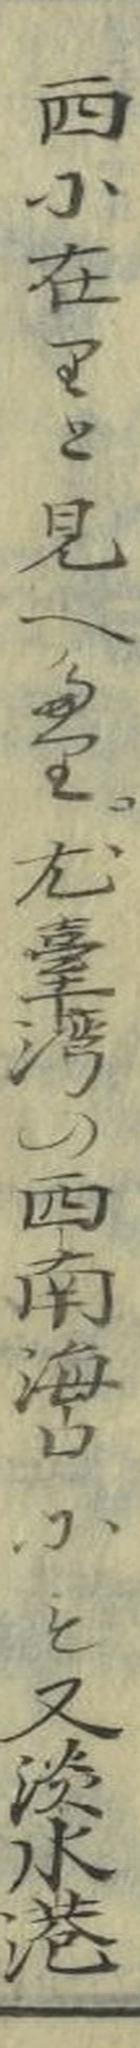西に在りと見へたり。尤台湾の西南海-口にも又淡水港
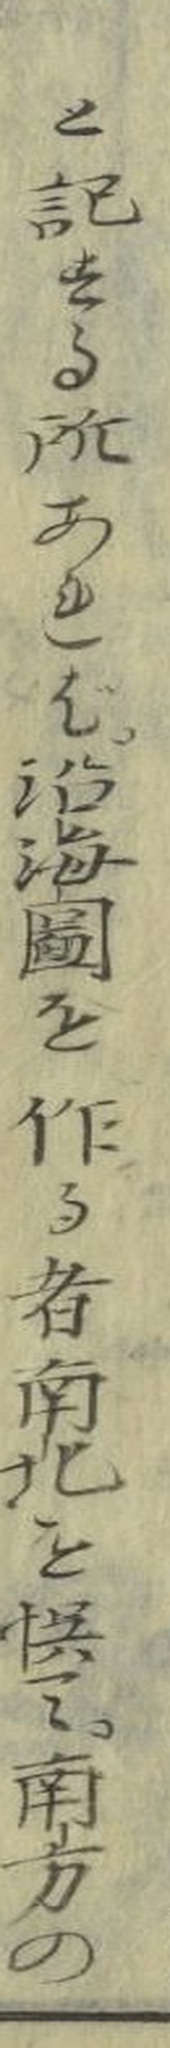と記する所あれば。沿海図を作る者南北を誤て。南方の
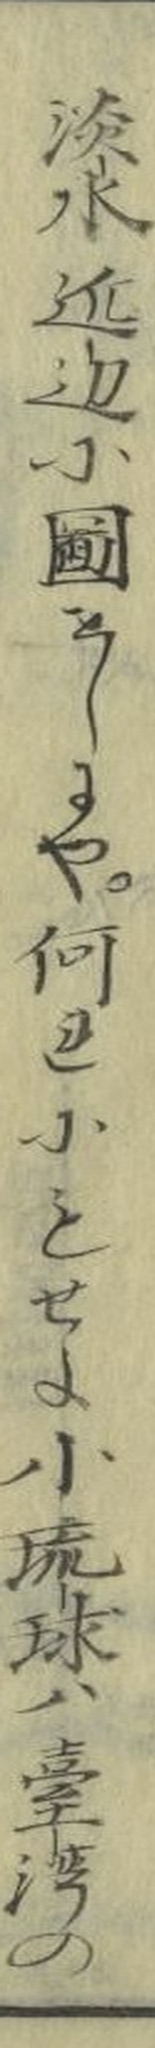淡-水近-辺に図せしにや。何れにもせよ小琉-球は台-湾の
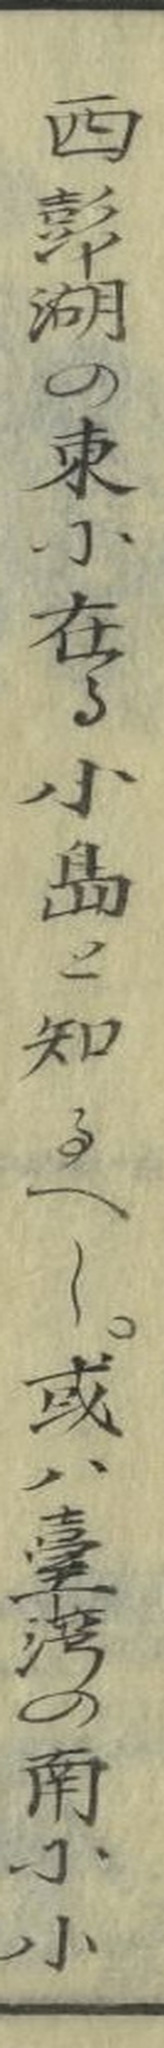西彭-湖の東に在る小島と知るへし。或は台-湾の南に小
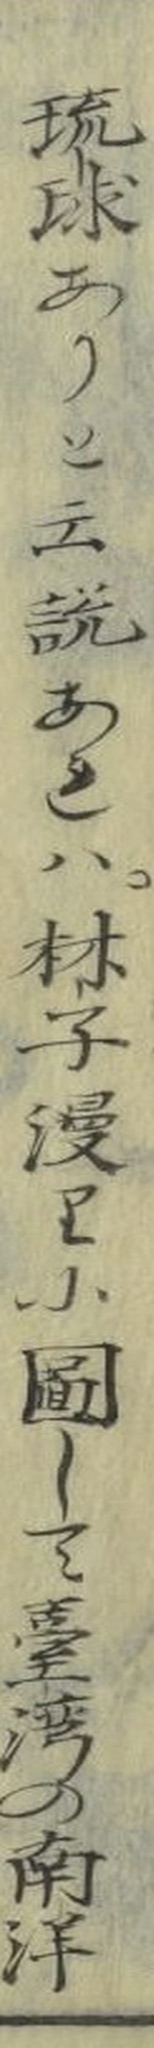琉-球ありと云説あれは。林-子漫りに図して台-湾の南洋
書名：琉球沿革志 上
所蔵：University of the Ryukyus Library
